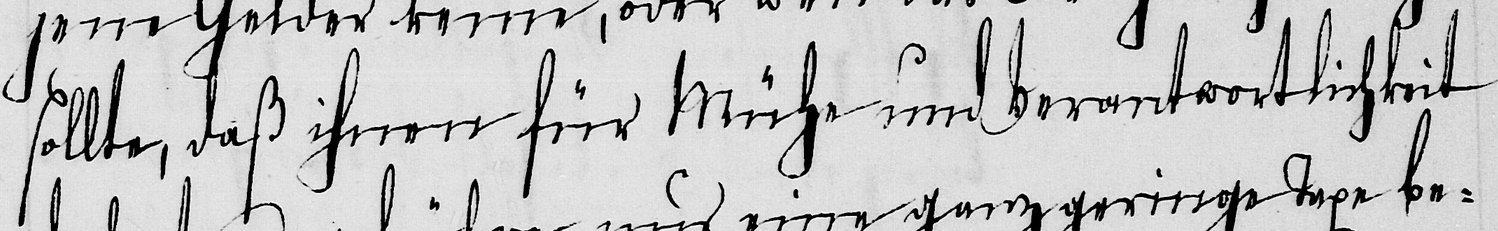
lte, daß ihnen für Mühe und Verantwortlichkeit
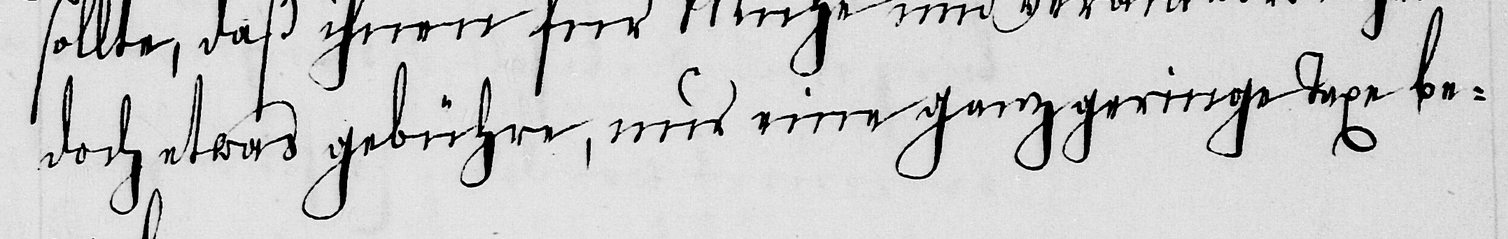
doch etwas gebühre, nur eine ganz geringe Taxe be¬
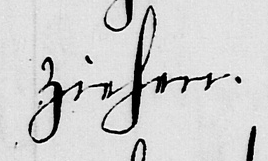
ziehen.
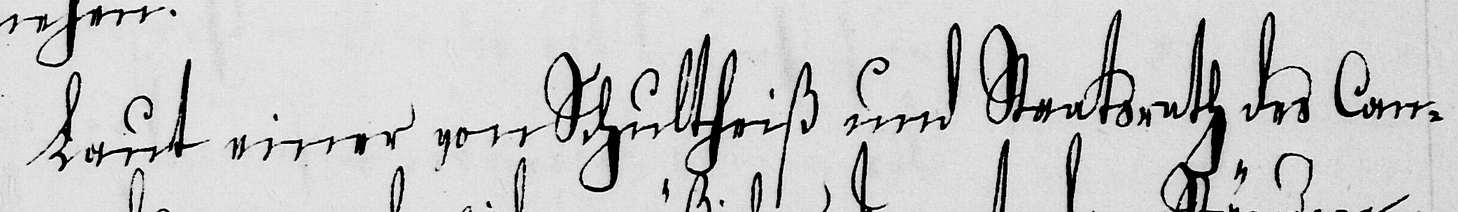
Laut einer von Schultheiß und Staatsrath des Can¬
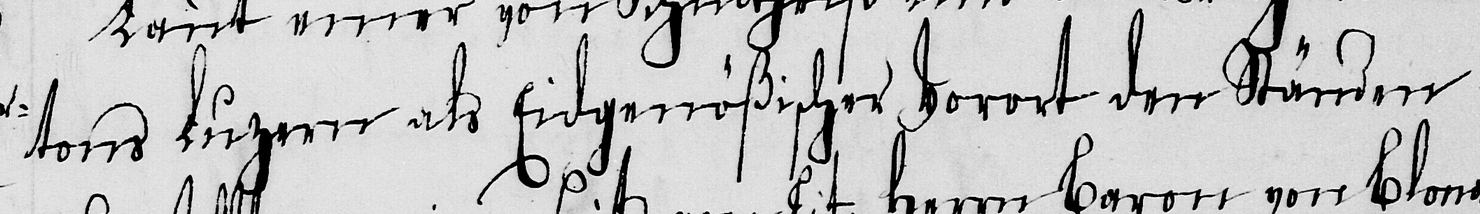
tons Luzern als Eidgenößischer Vorort den Ständen
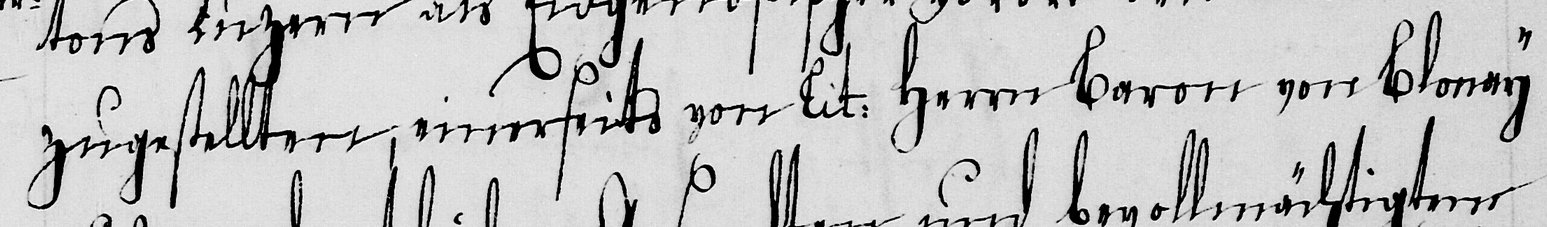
zugestellten, einerseits von Tit: Herrn Baron von Blonay
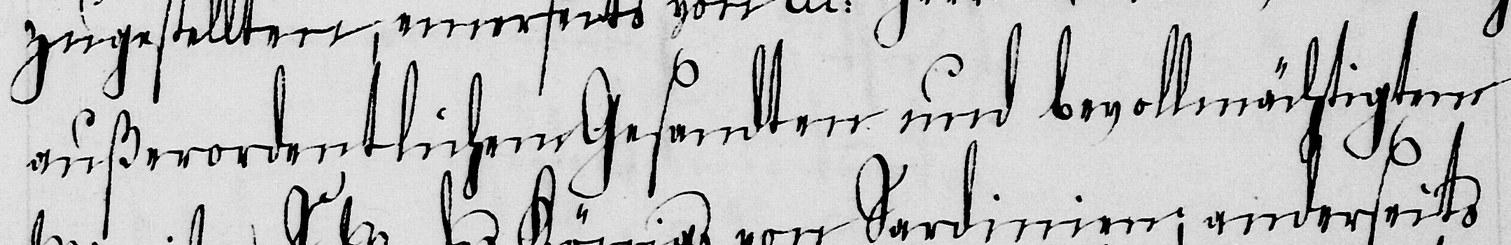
außerordentlichen Gesandten und bevollmächtigtem
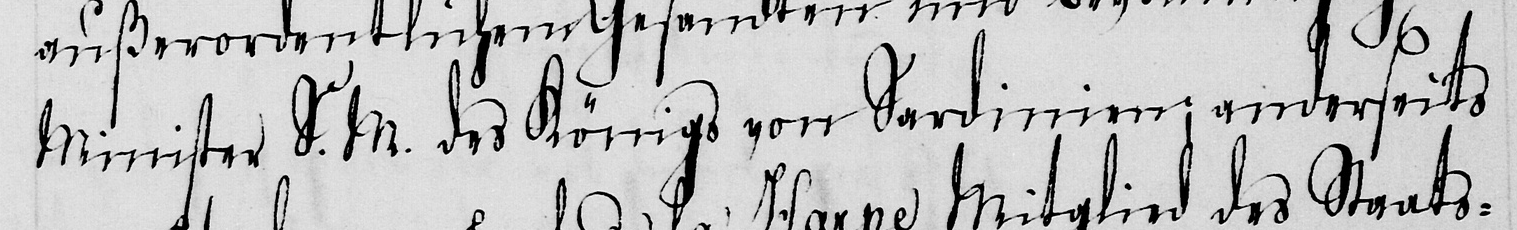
Minister S. M. des Königs von Sardinien; anderseits
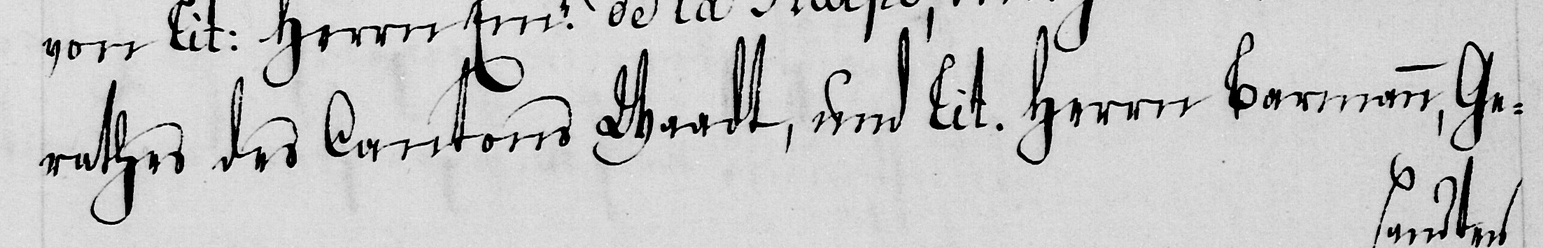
rathes des Cantons Waadt, und Tit. Herrn Barmann, Ge-
